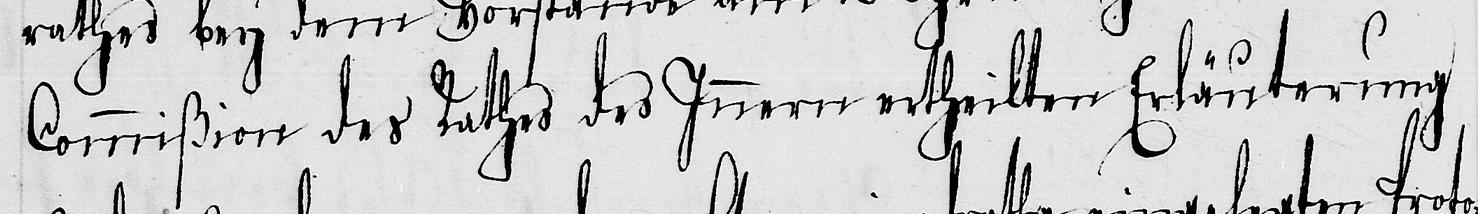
Commißion des Rathes des Innern ertheilten Erläuterung
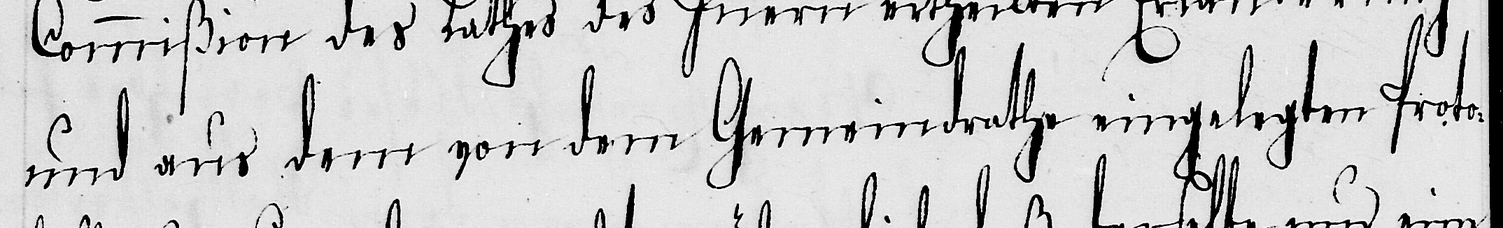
und aus dem von dem Gemeindrathe eingelegten Prot¬
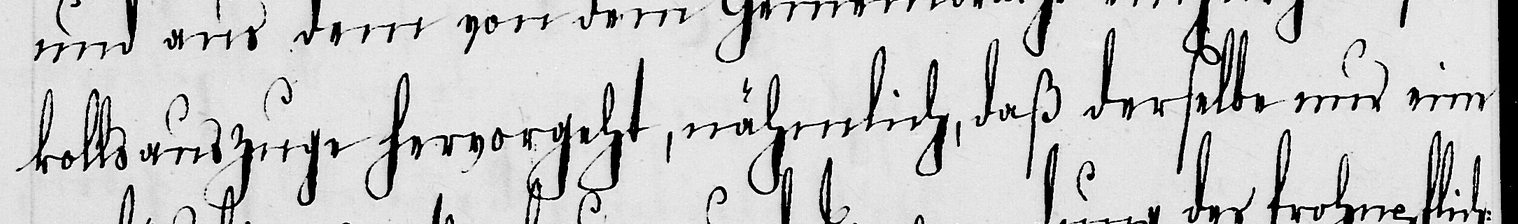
okollsauszuge hervorgeht, nähmlich, daß derselbe nur eine
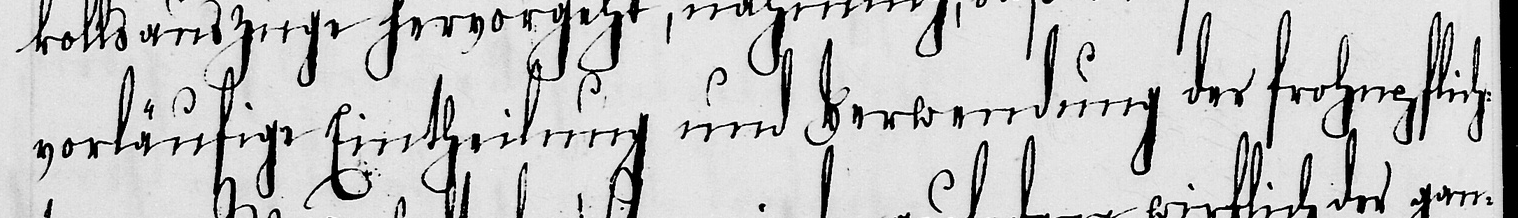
vorläufige Eintheilung und Verwendung der frohnpflic¬
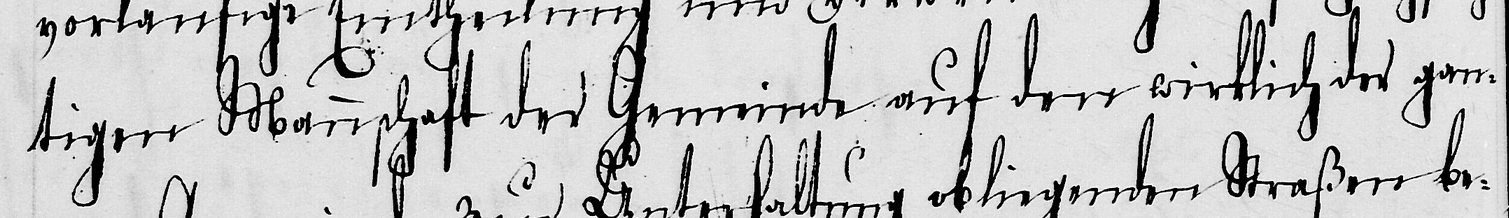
htigen Mannschaft der Gemeinde auf den wirklich der ga¬
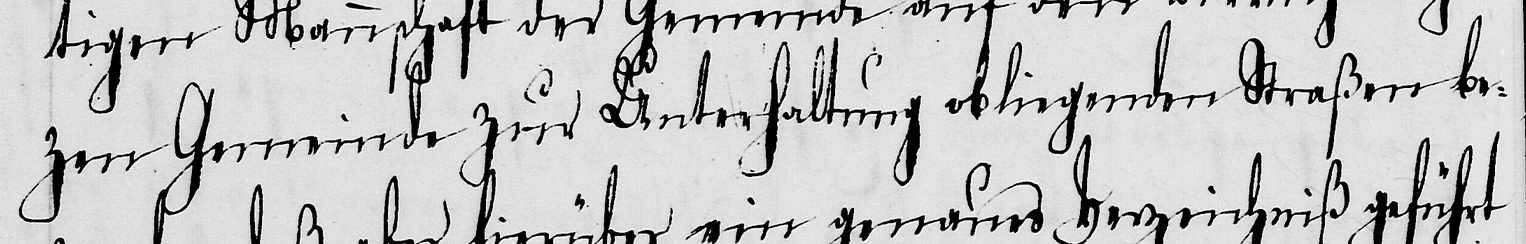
nzen Gemeinde zur Unterhaltung obliegenden Straßen be¬
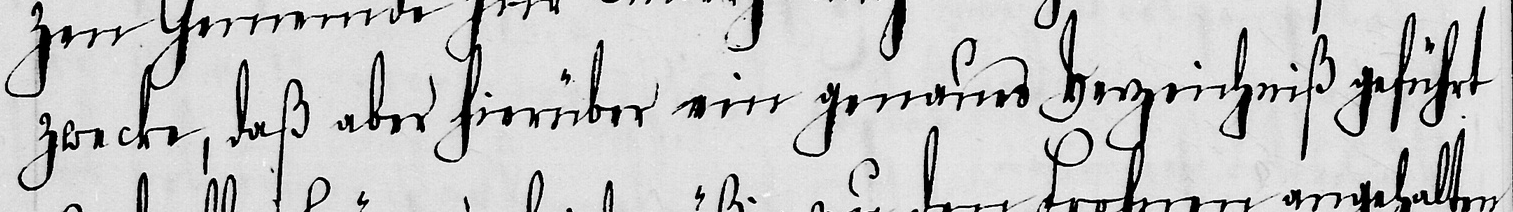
zwecke, daß aber hierüber ein genaues Verzeichniß geführt
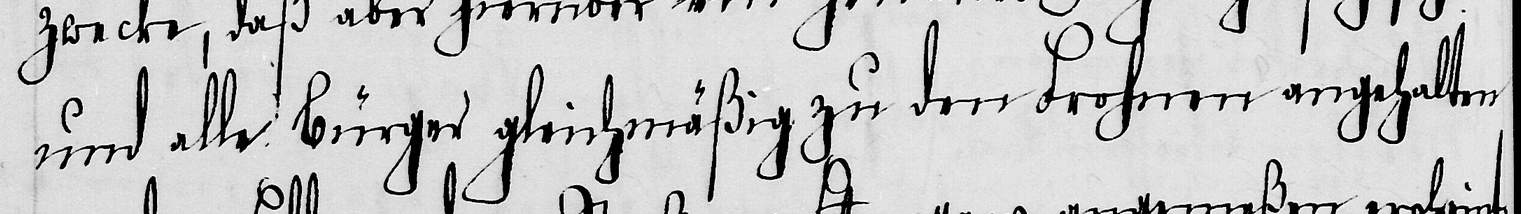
und alle Bürger gleichmäßig zu den Frohnen angehalten
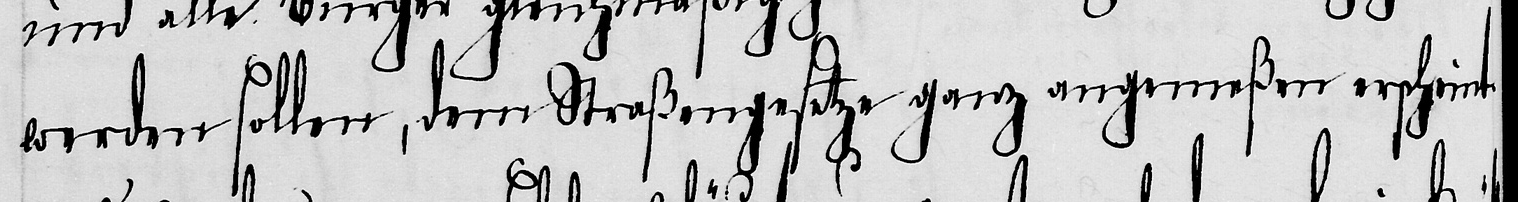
werden sollen, dem Straßengesetze ganz angemeßen erschei¬
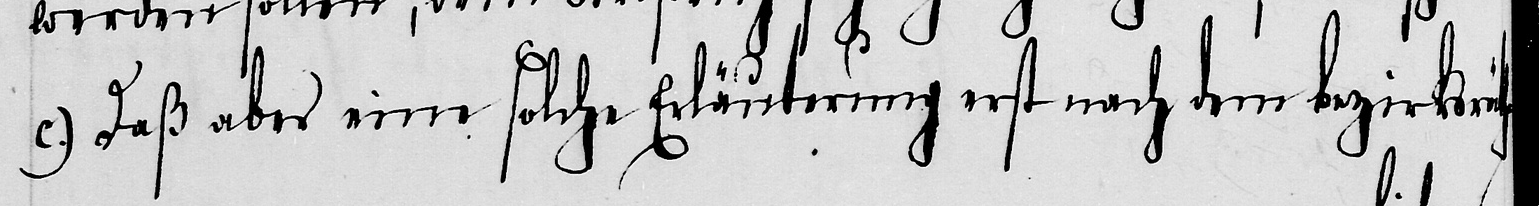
c.) Daß aber eine solche Erläuterung erst nach dem bezirksrät¬
